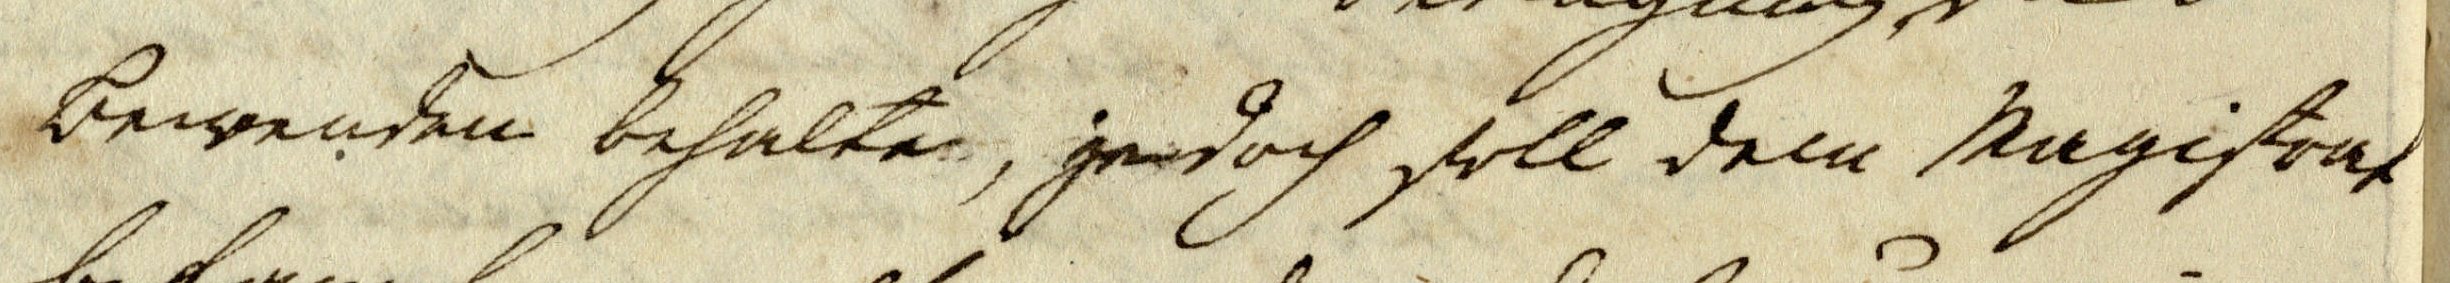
Bewenden behalten, jedoch soll dem Magistrat
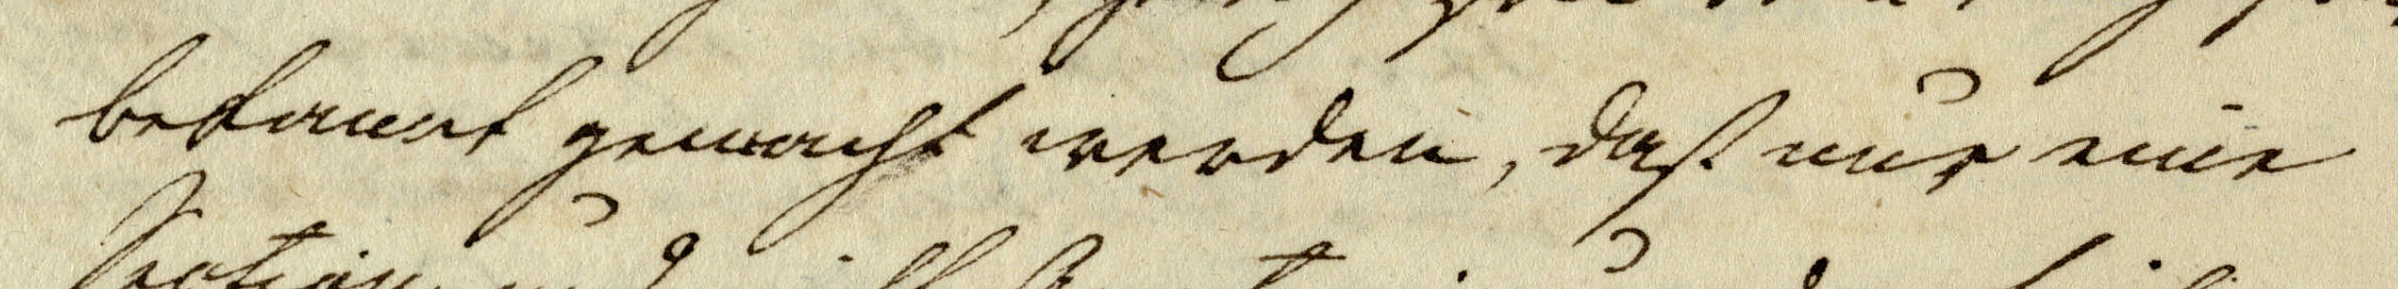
bekannt gemacht werden, daß nur eine
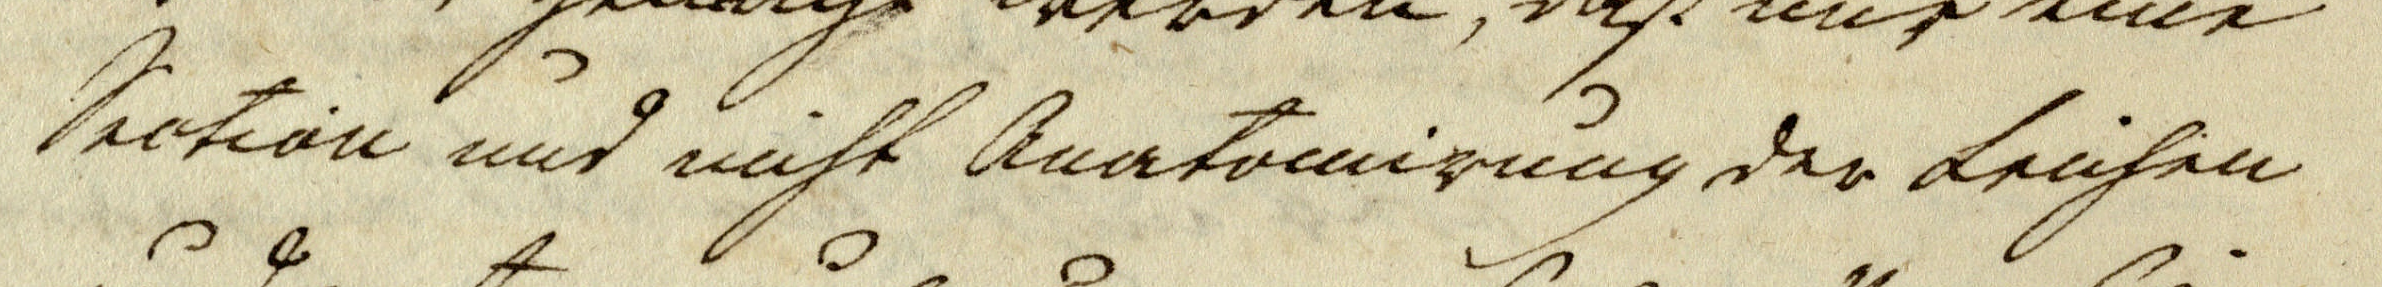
Section und nicht Anatomirung der Leichen
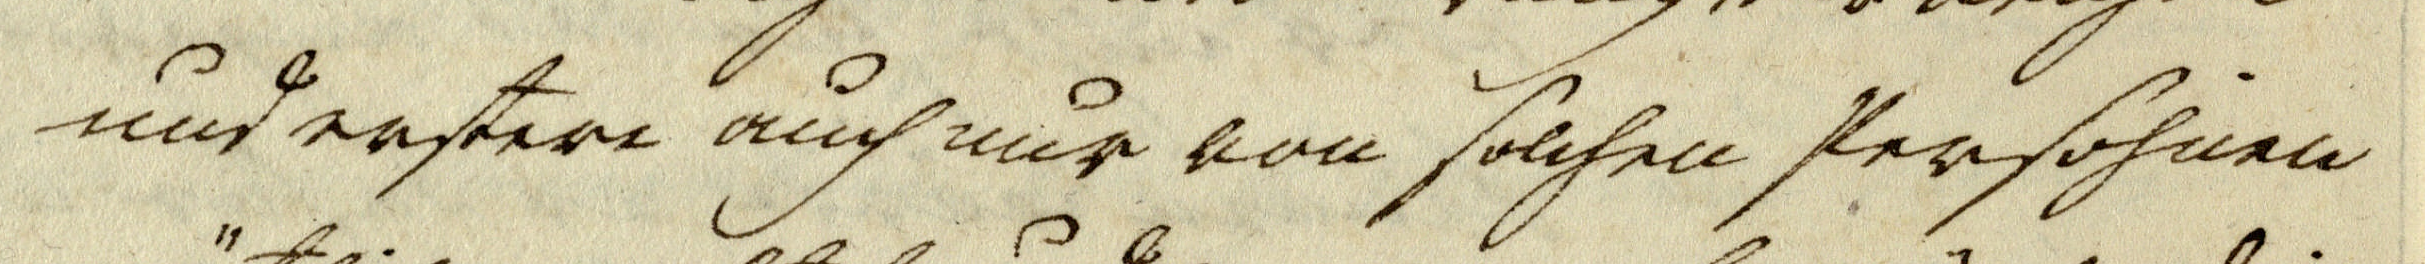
und erstere auch nur von solchen Persohnen
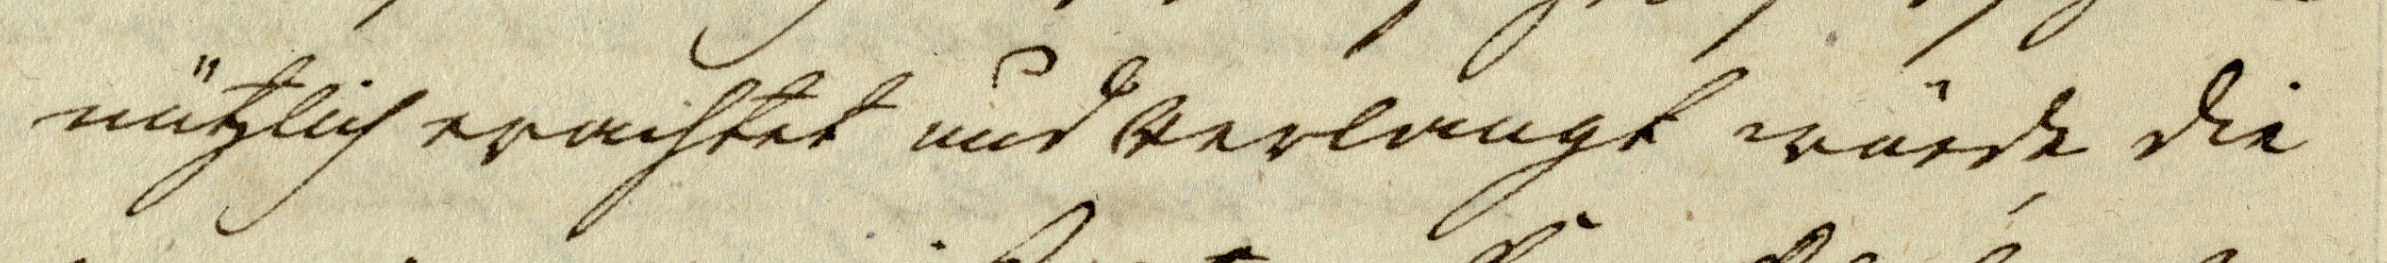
nützlich erachtet und verlangt würde, die
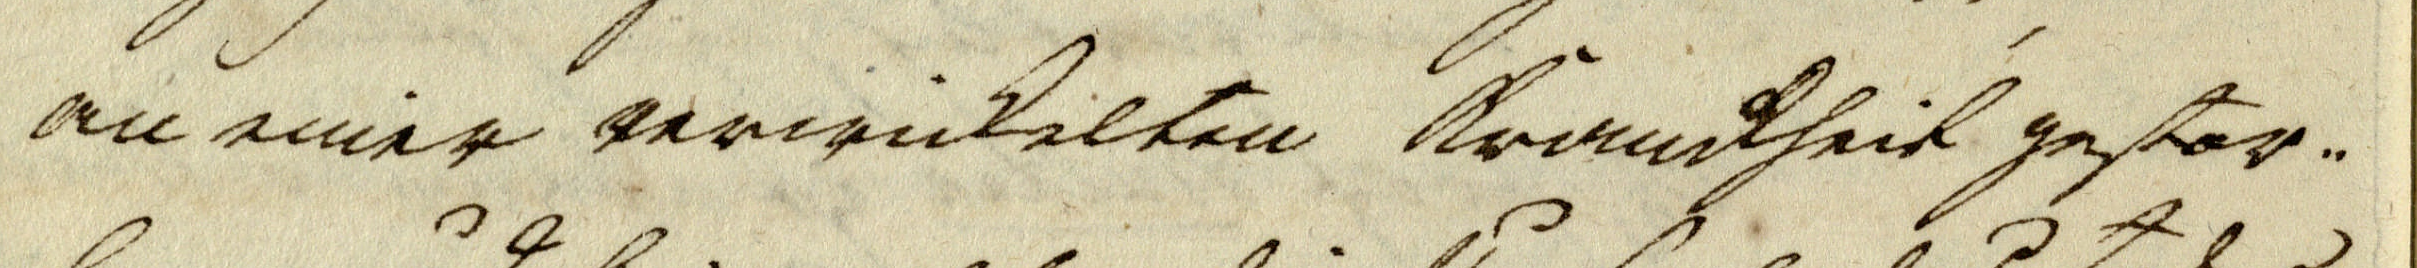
an einer verwickelten Kranckheit gestor¬
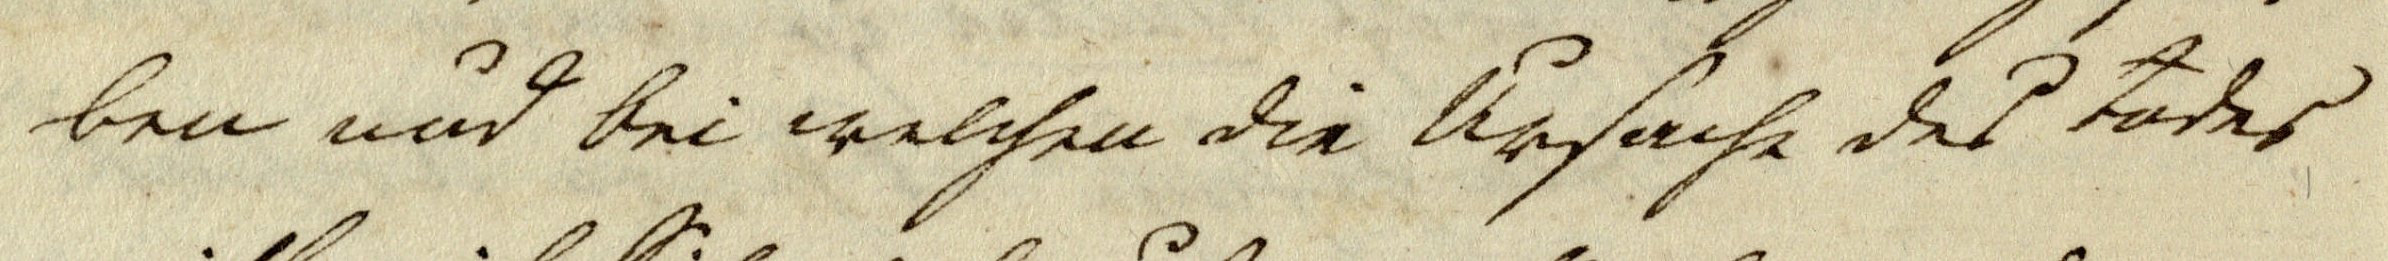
ben und bei welchen die Ursache der Todes
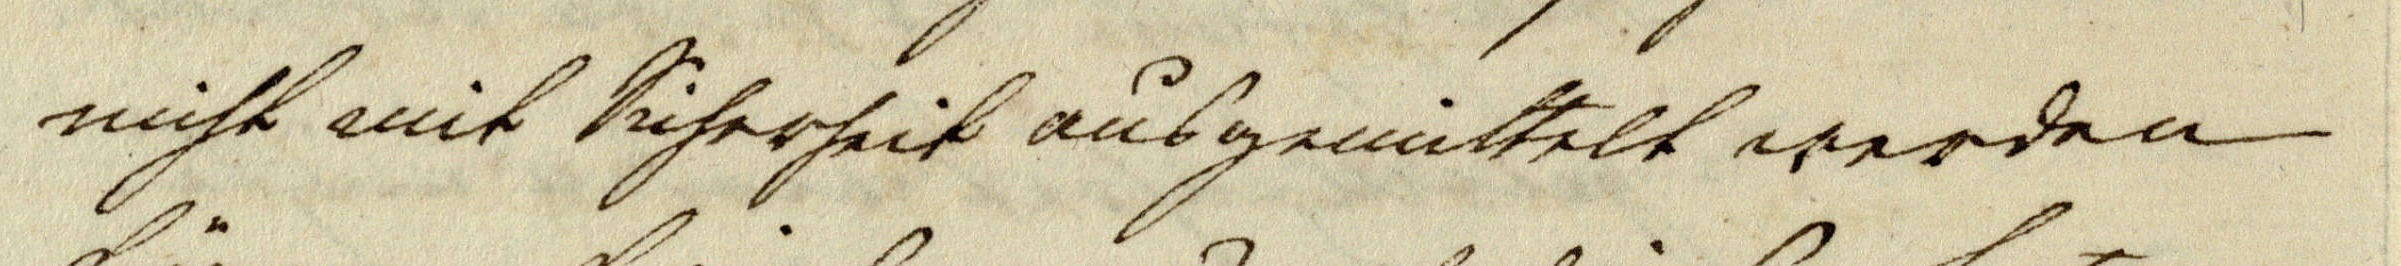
nicht mit Sicherheit ausgemittelt werden
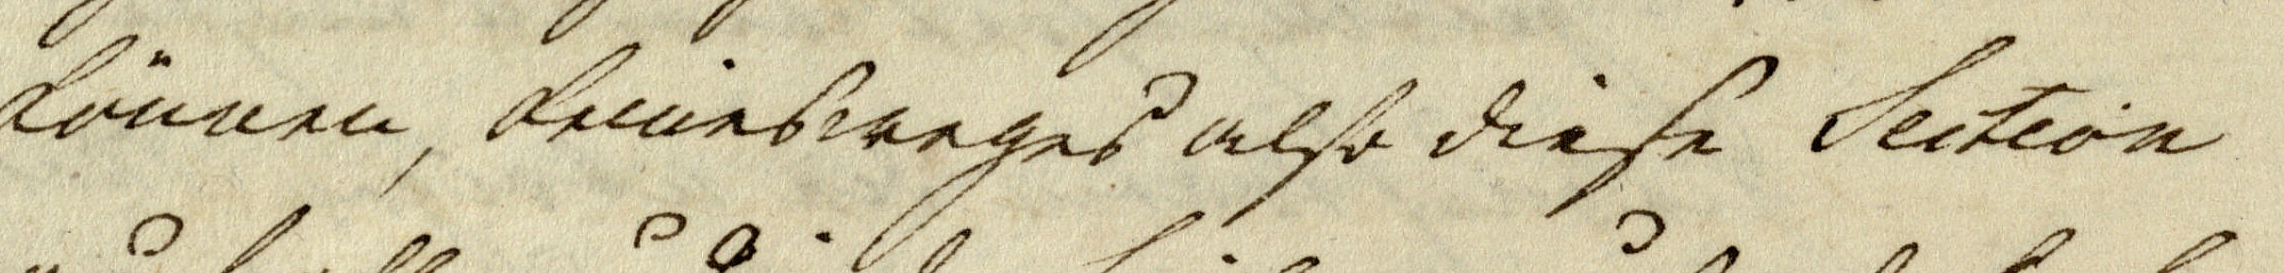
können, keinesweges also diese Section
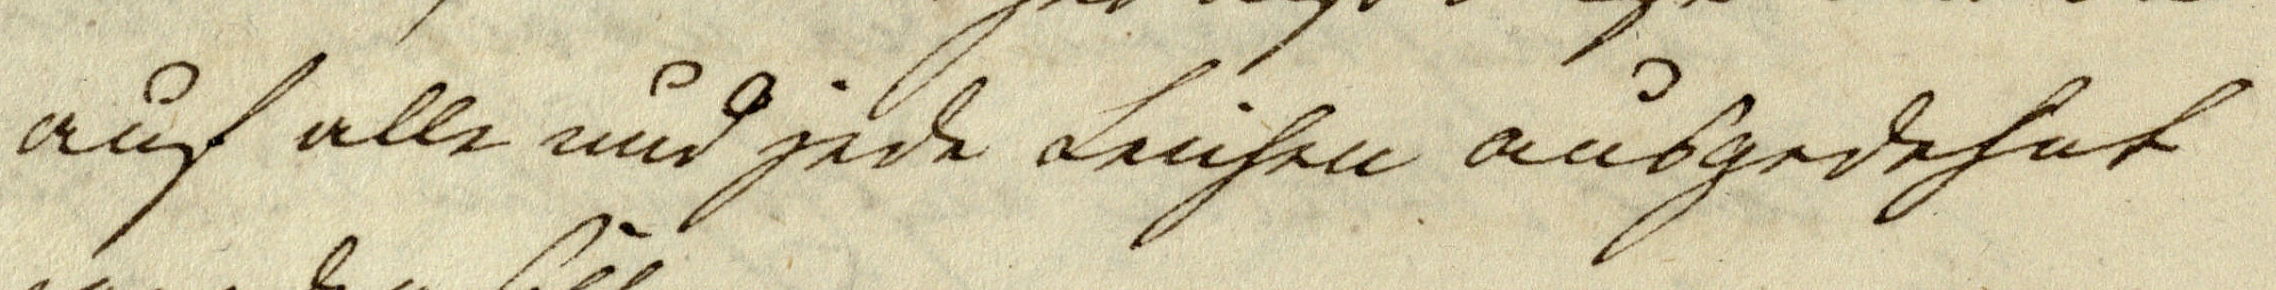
auf alle und jede Leichen ausgedehnt
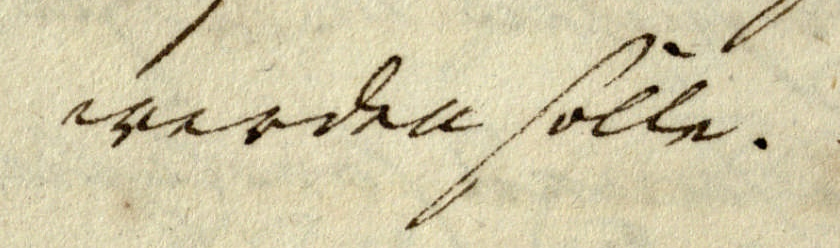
werden solle.
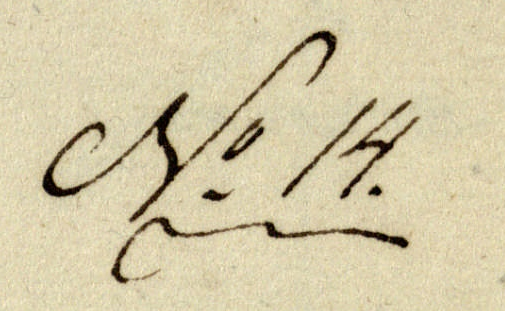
No 14.
